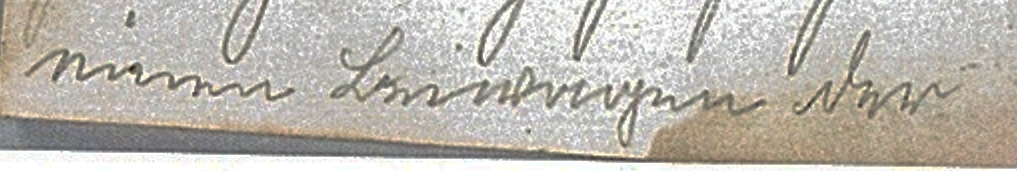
einen Beiwagen der
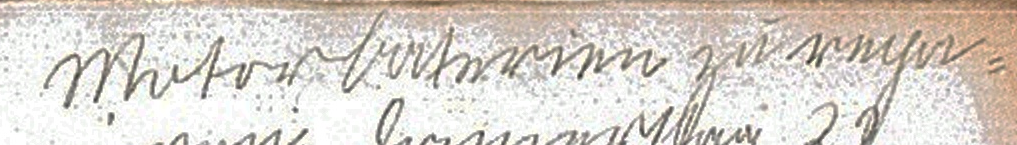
Motorbaterien zu repe-
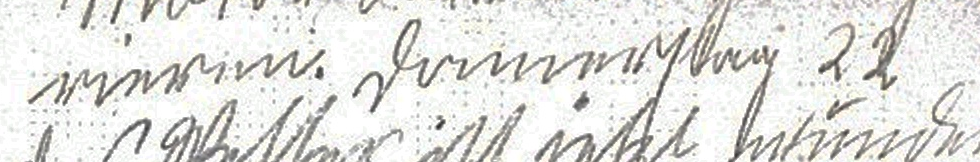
rieren. Donnerstag 22
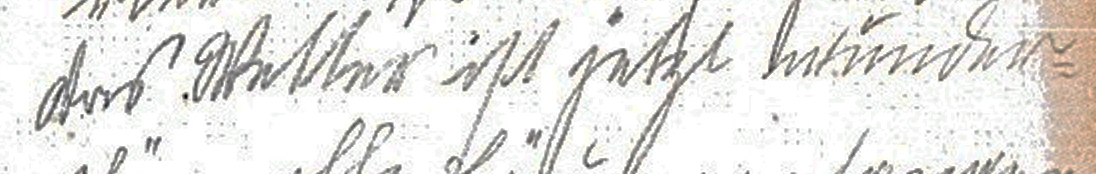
das Wetter ist jetzt wieder
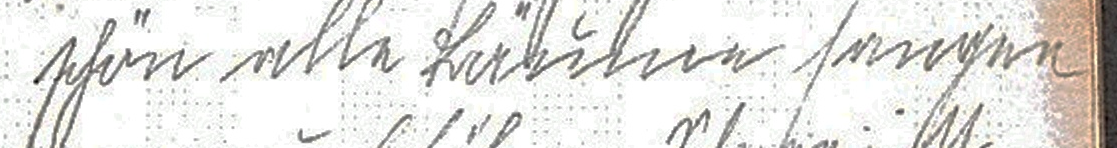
schön alle Bäume fangen
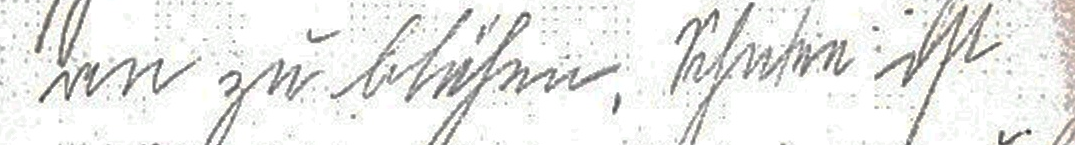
an zu blühen. Schnee ist
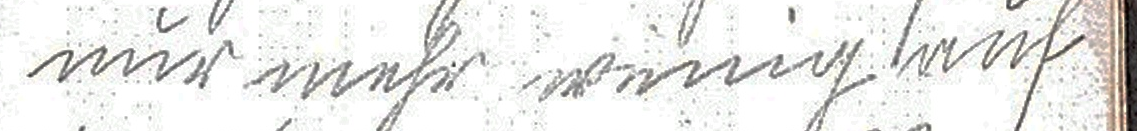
nur mehr wenig auf
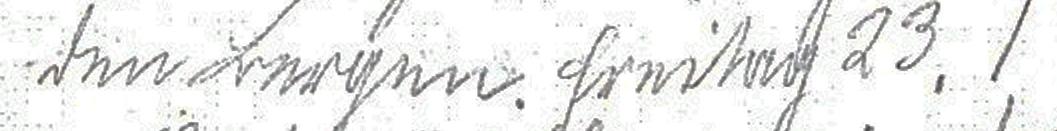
den Bergen. Freitag 23.
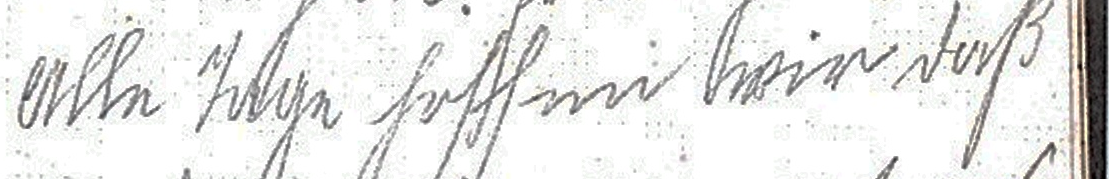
Alle Tage hoffen wir daß
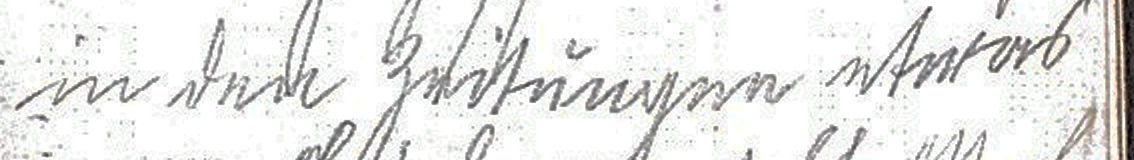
in den Zeitungen etwas
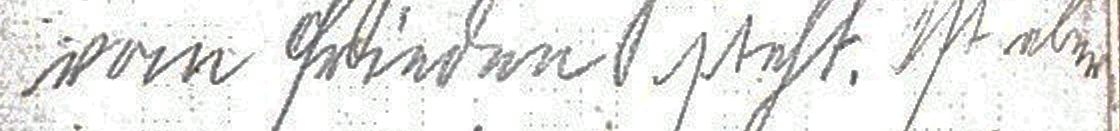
vom Frieden steht. Ist aber
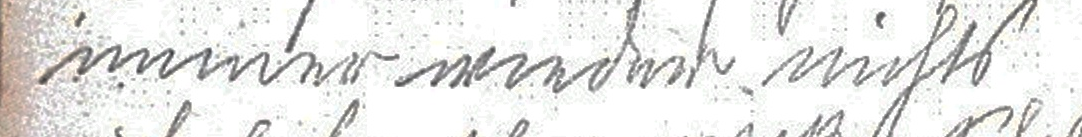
immer wieder nichts
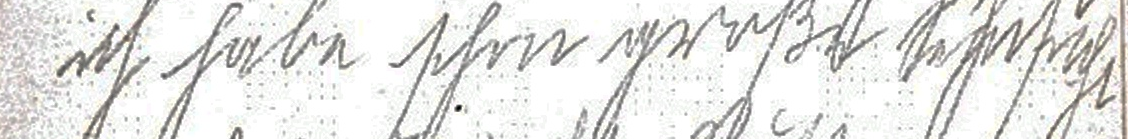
ich habe schon große Sehnsucht
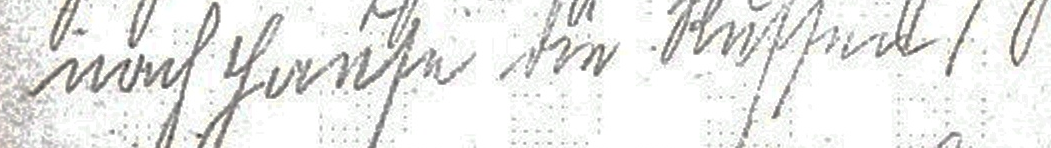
nach Hause die Russen
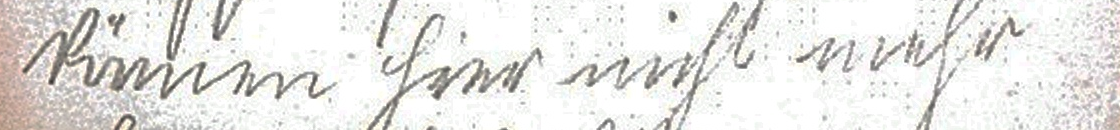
können hier nicht mehr
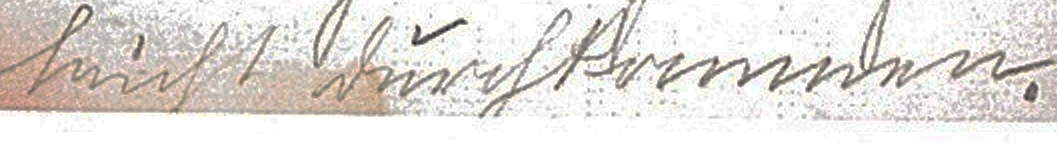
leicht durchkommen.
